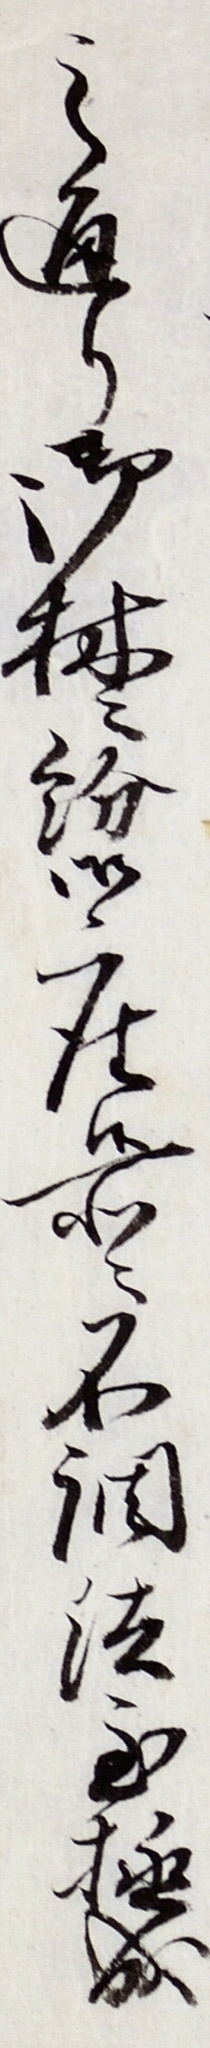之通り御林ニ紛御座候所ニ不調法至極成
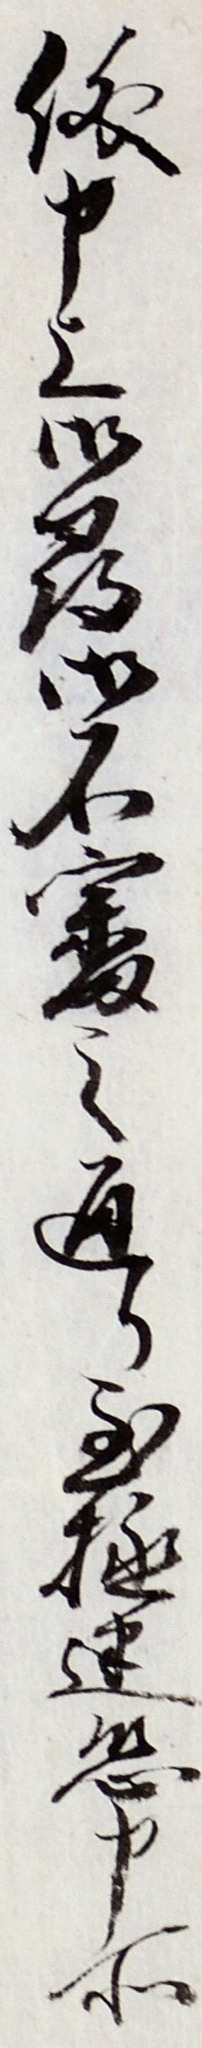儀申上御尋御不審之通り至極迷惑申所
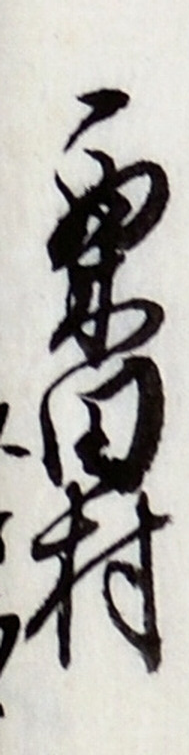栗田村
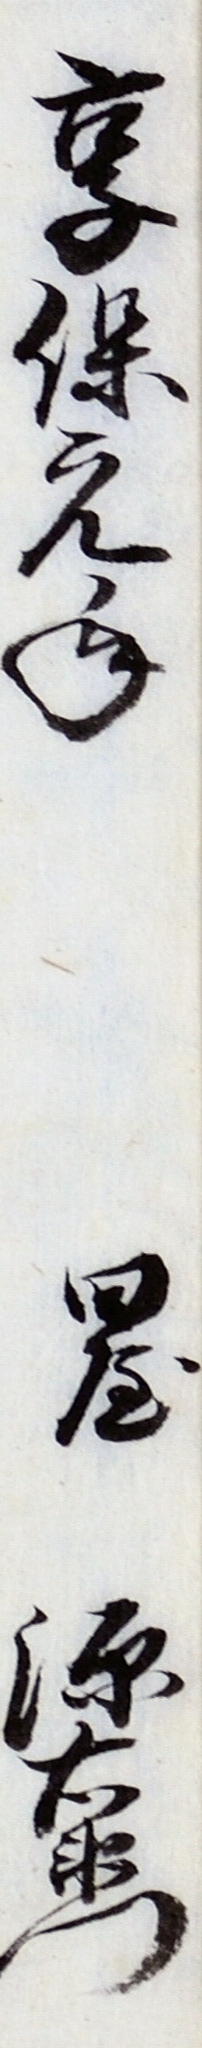享保元年田屋源右衛門
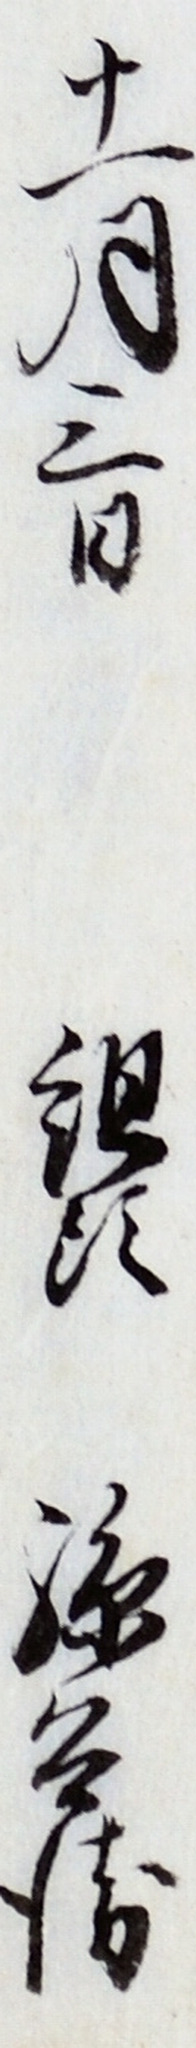十一月三日組頭孫兵衛
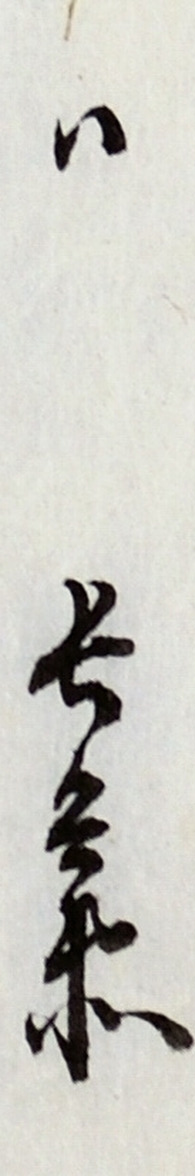同長兵衛
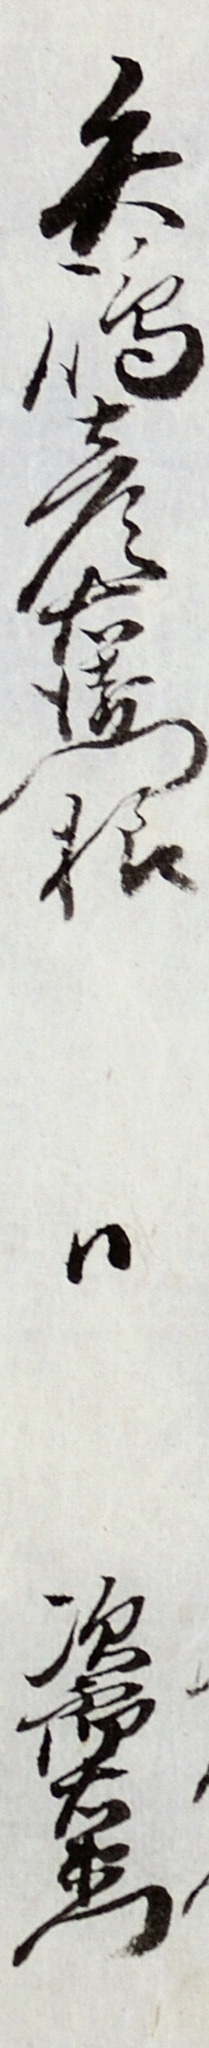矢嶋彦右衛門様同次郎右衛門
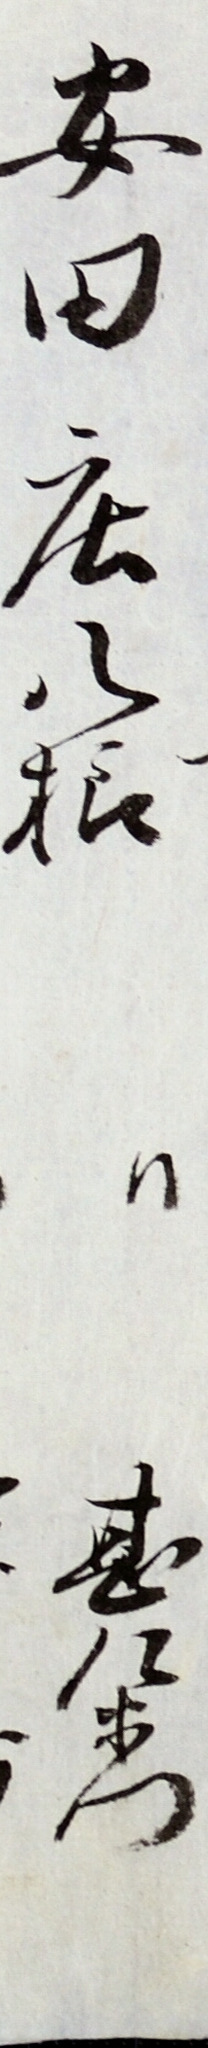安田庄八様同甚左衛門
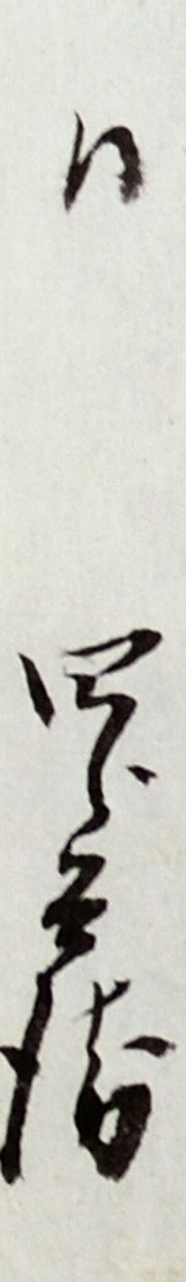同四郎兵衛

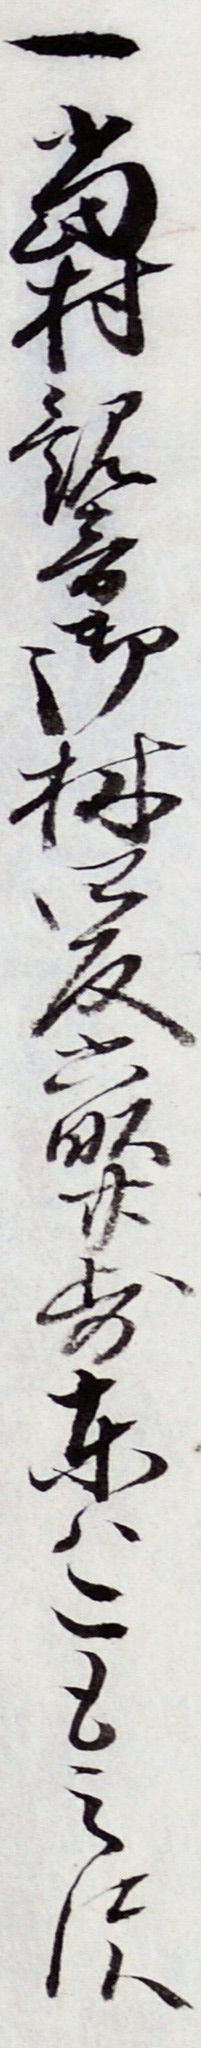一当村観音御林四反六畝廿歩東ハこも之沢
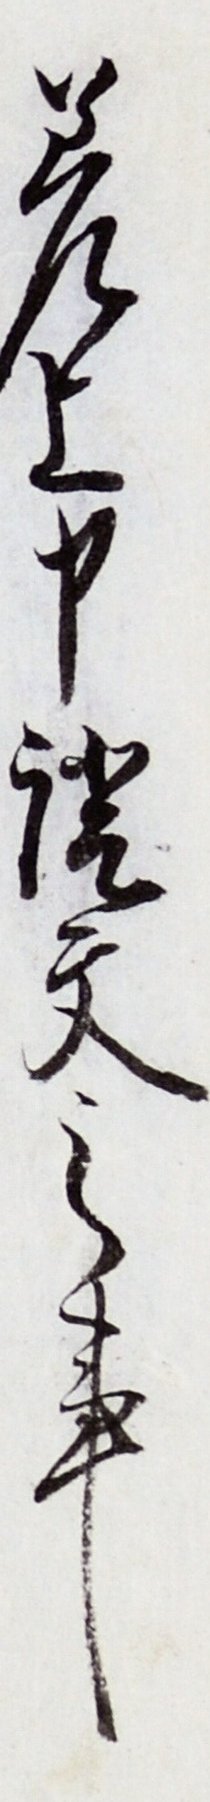差上申証文之事
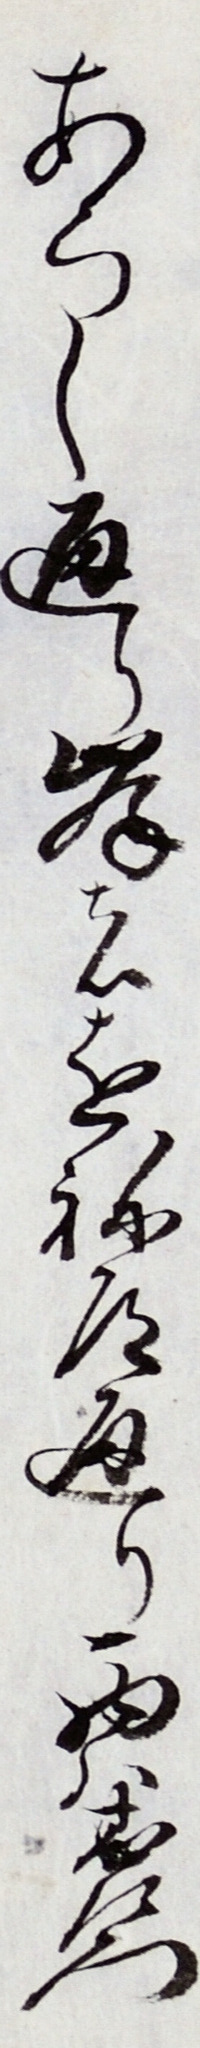あらし通り岸はをね道通り西ハ甚左衛門
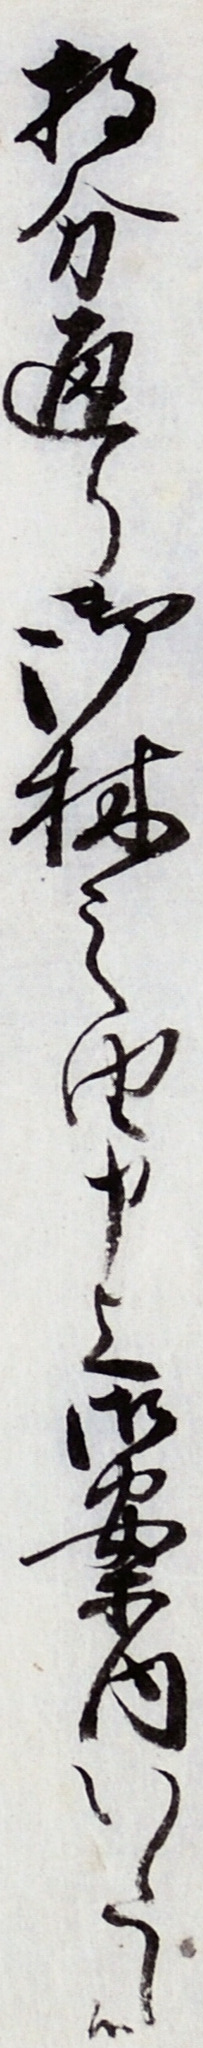持分通り御林之由申上御案内いたし候
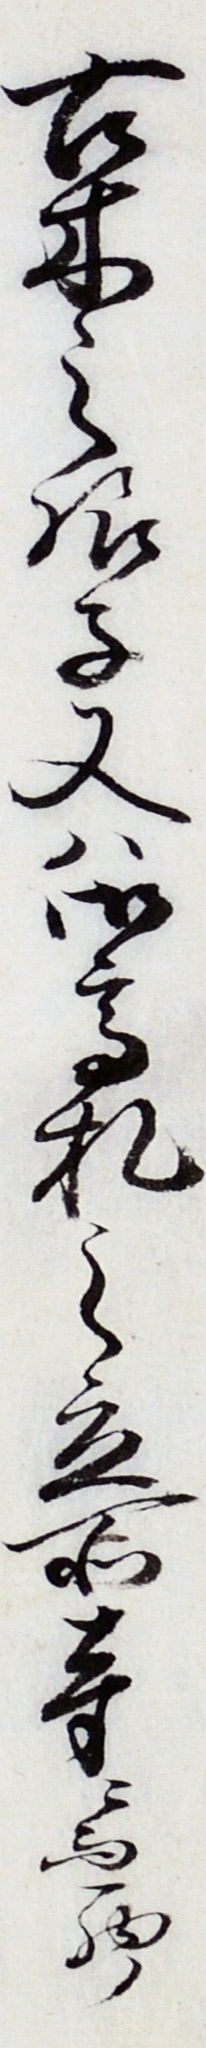古木之銀子又ハ御高札之立所寺ニ而西ノ
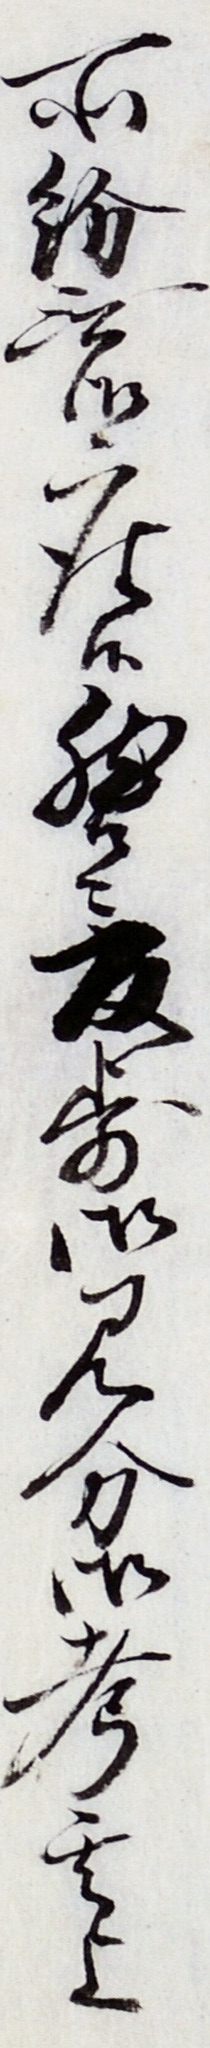所紛無御座候然ルニ反歩御見分御考其上
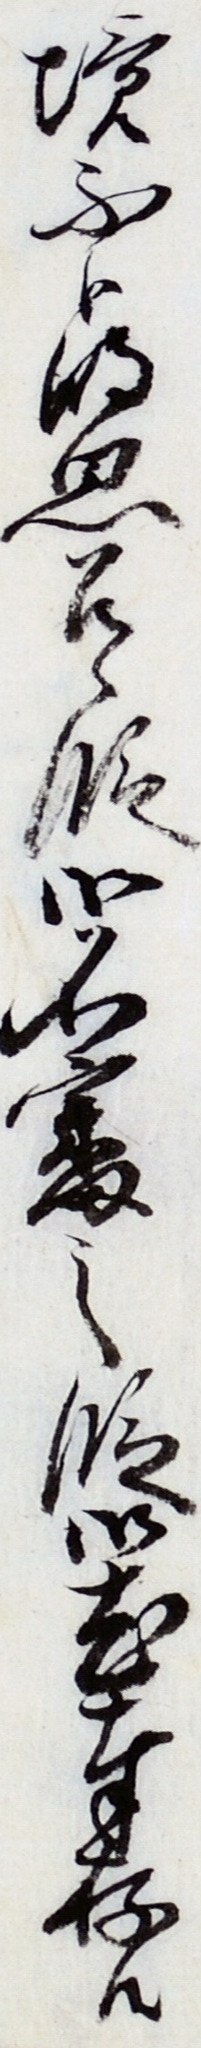境不分明思召候段御不審之段御尤奉存候
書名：御林御竹藪証文控
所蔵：伊那市立高遠町図書館・合同会社AMANE
